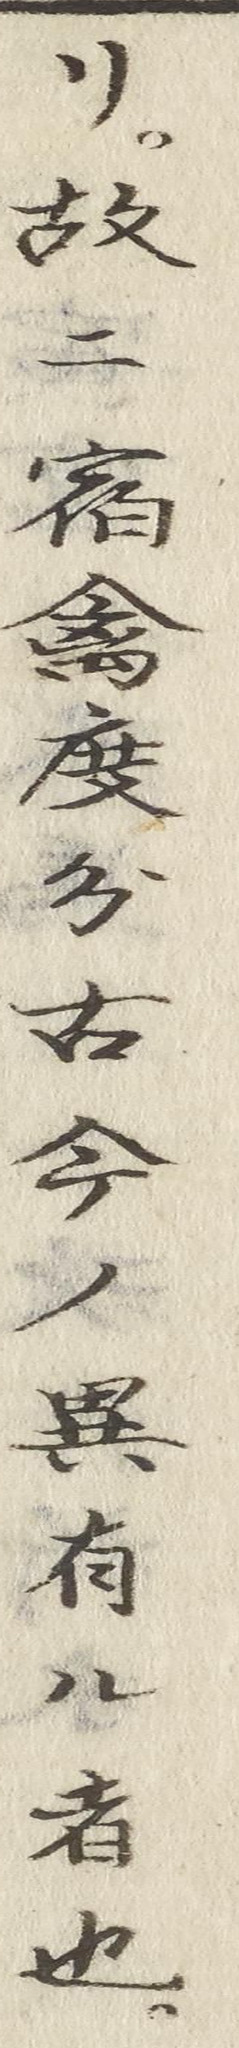リ。故ニ宿禽度分古今ノ異有ル者也。
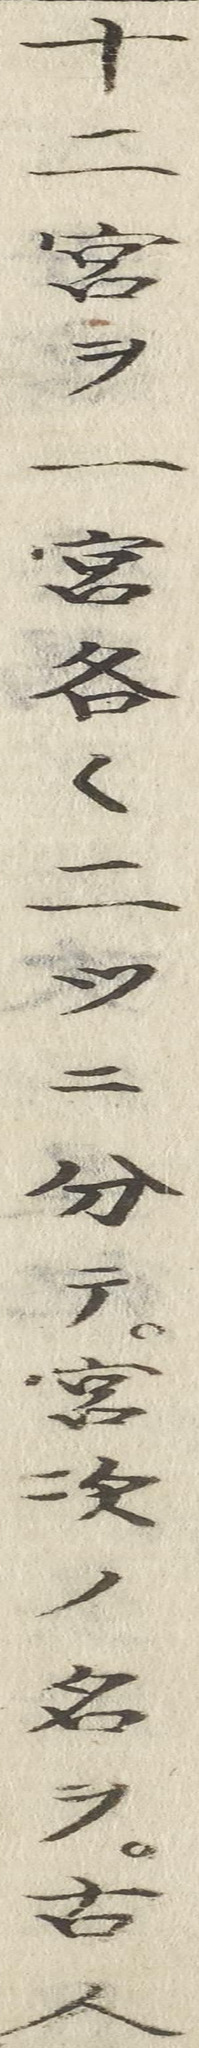十二宮ヲ一宮各〳〵二ツニ分テ。宮次ノ名ヲ。古人
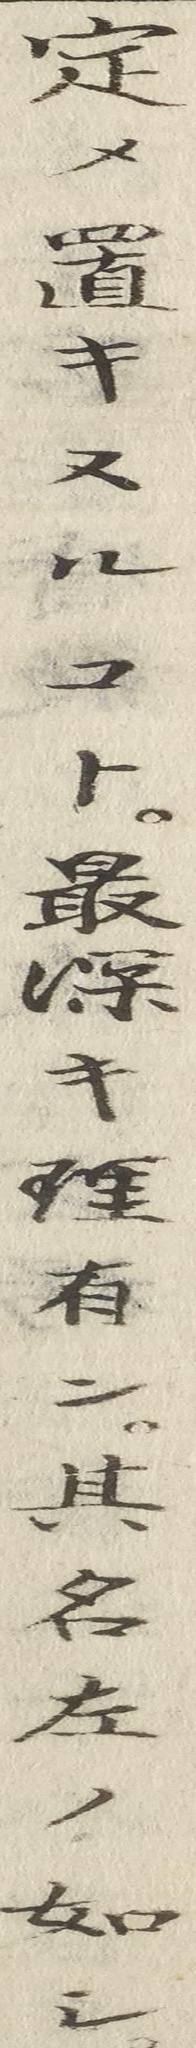定メ置キヌルコト。最深キ理有ン。其名左ノ如シ。

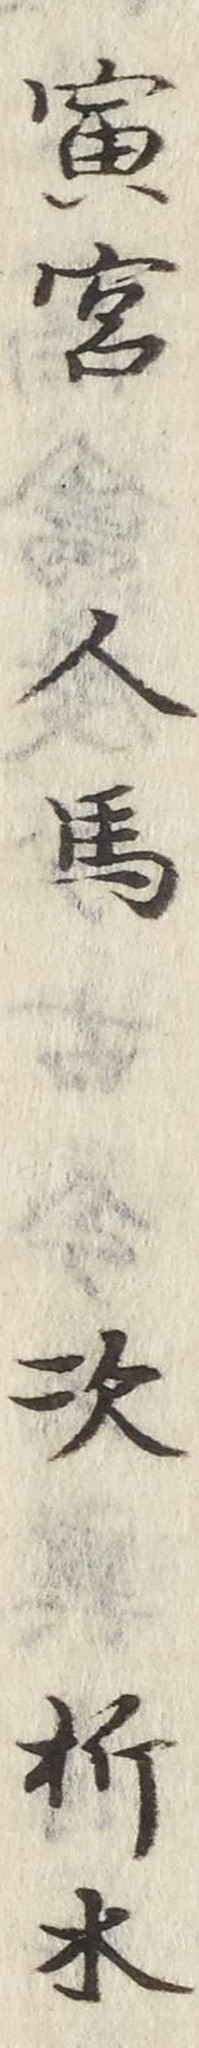寅宮人馬次析木
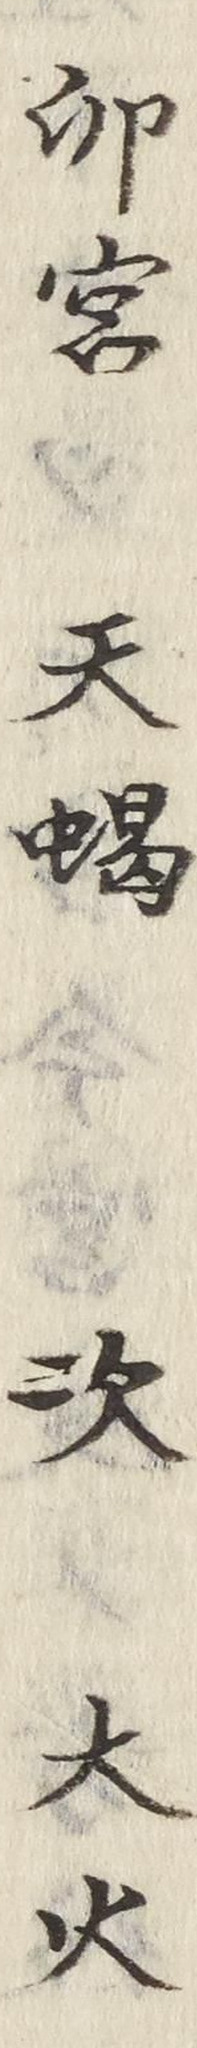卯宮天蝎次大火
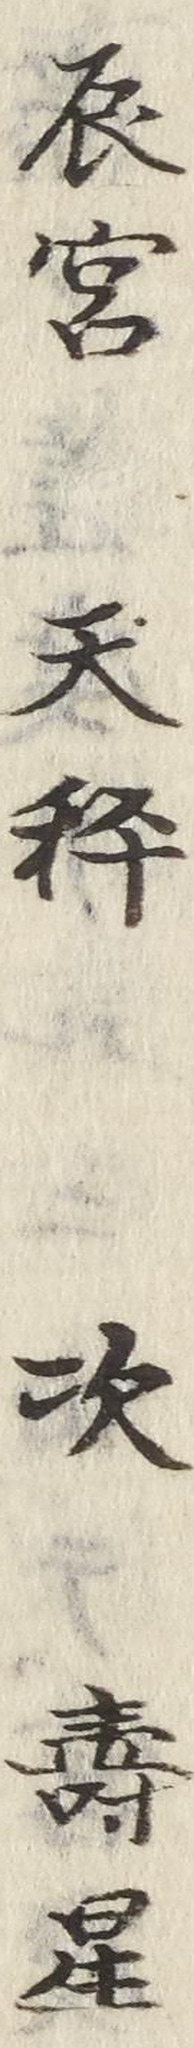辰宮天秤次寿星
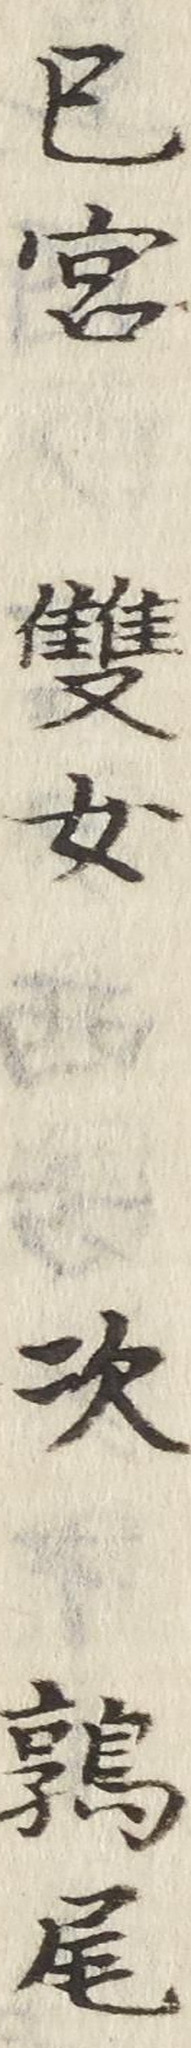巳宮双女次鶉尾
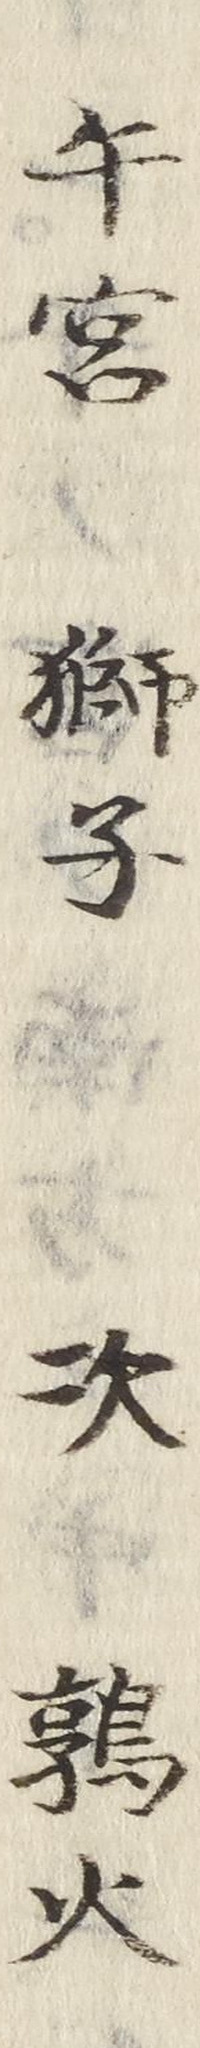午宮獅子次鶉火
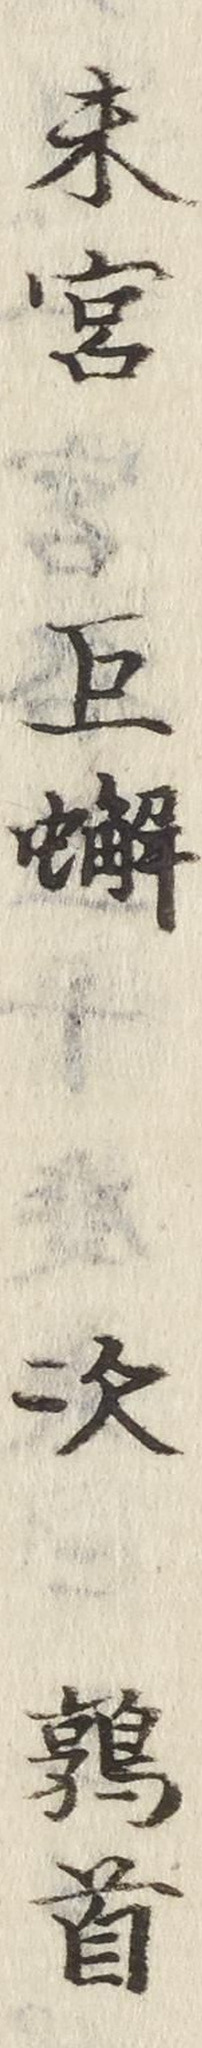未宮巨蟹次鶉首
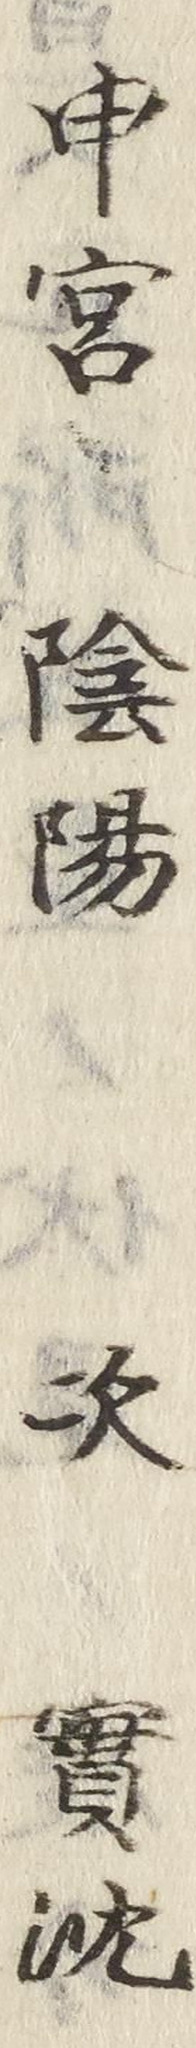申宮陰陽次実沈
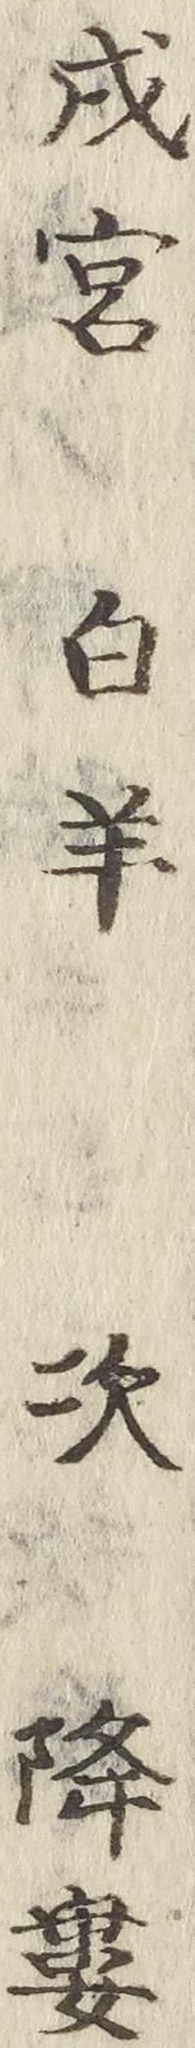戌宮白羊次降婁
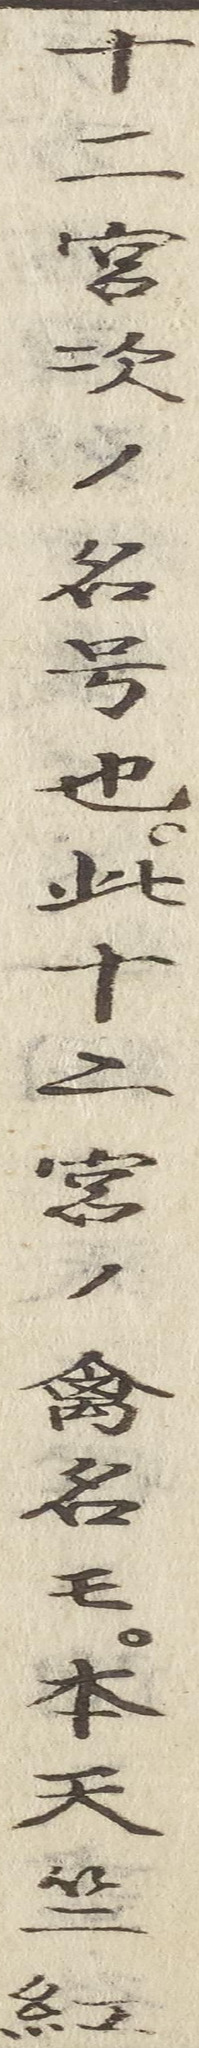十二宮次ノ名号也。此十二宮ノ禽名モ。本天竺紅
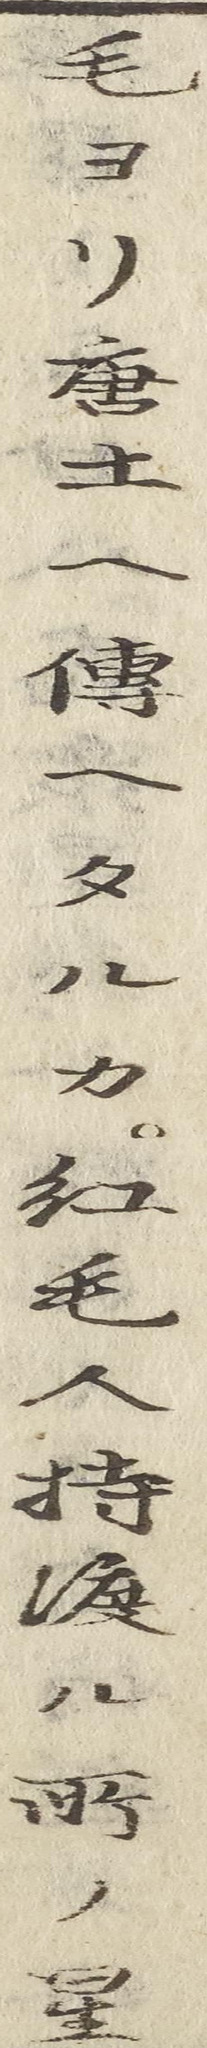毛ヨリ唐土ヘ伝ヘタルカ。紅毛人持渡ル所ノ星
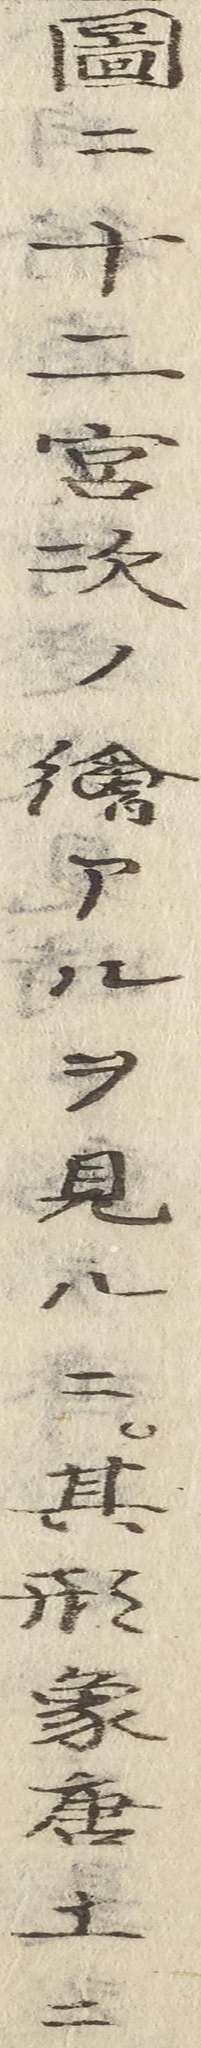図ニ十二宮次ノ絵アルヲ見ルニ。其形象唐土ニ
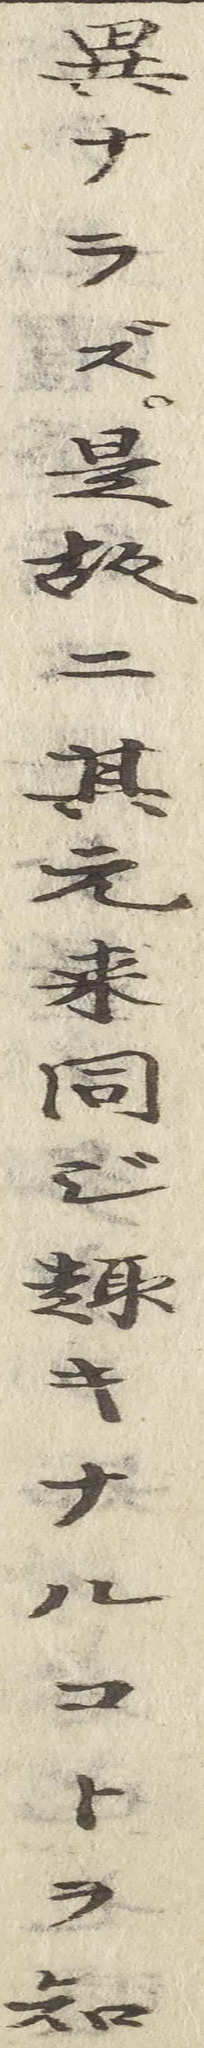異ナラズ。是故ニ其元来同ジ趣キナルコトヲ知
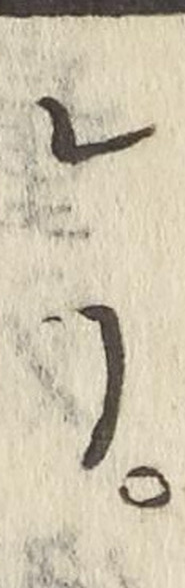レリ。
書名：大略天学名目鈔　天經或問附録
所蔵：東京大学地震研究所図書室 Earthquake Research Institute Library, The University of Tokyo, JAPAN
